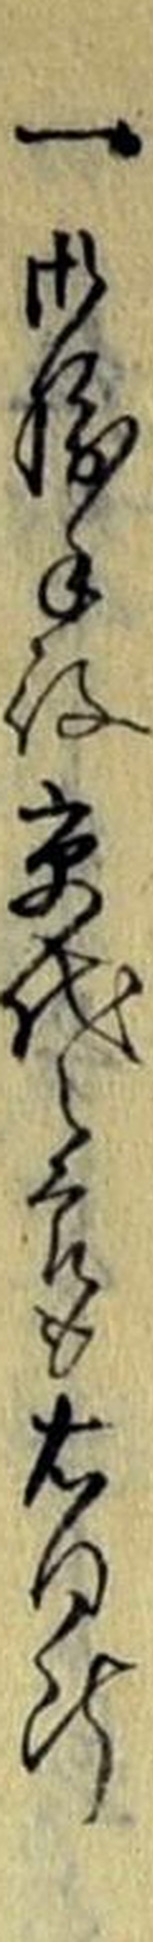一御勝手役交代之節も右同断
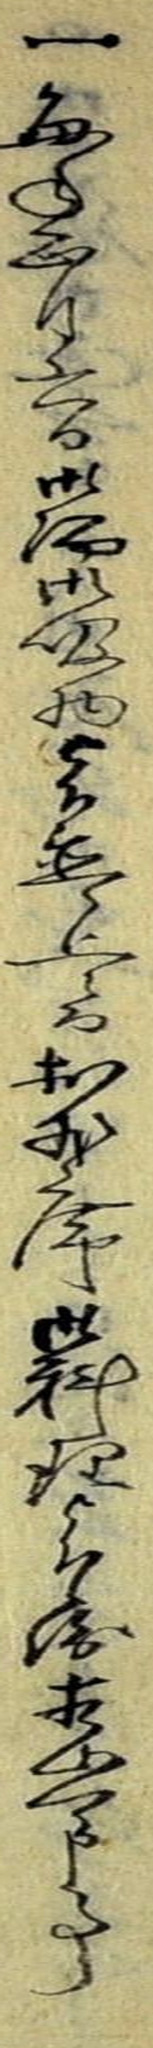一毎年正月六日御酒御吸物被下置候上に而於外席御料理被下候儀相止可申事
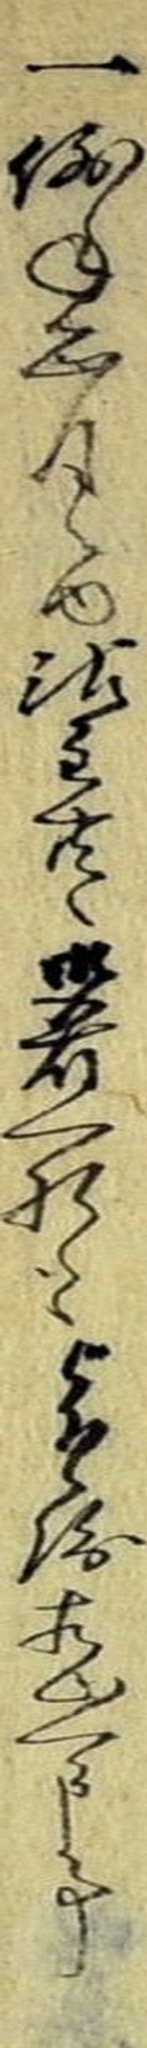一例年正月之内銀主共へ御肴一折つヽ被下候儀相止可申事
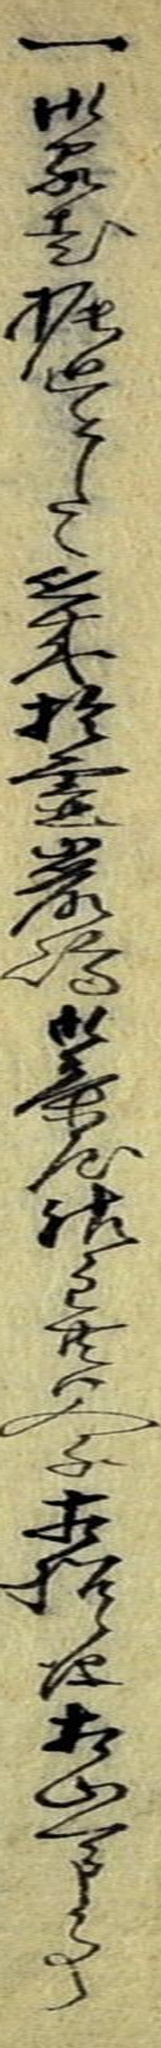一御家老振廻として近来於霊厳嶋御茶屋銀主共父子相招候儀相止可申事
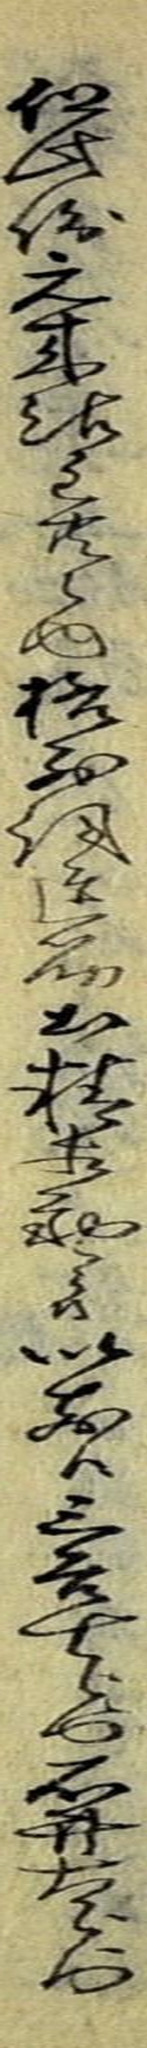但此儀元来銀主共之内格別調達筋出精相勤候に付以前は三谷七郎右衛門石井太郎右衛門
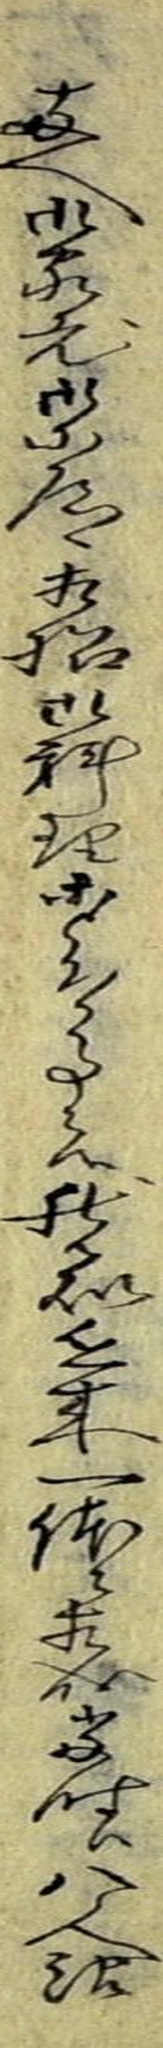両人御家老御小屋へ相招御料理等被下候事に候然処近来一体に相成当時は八人銀
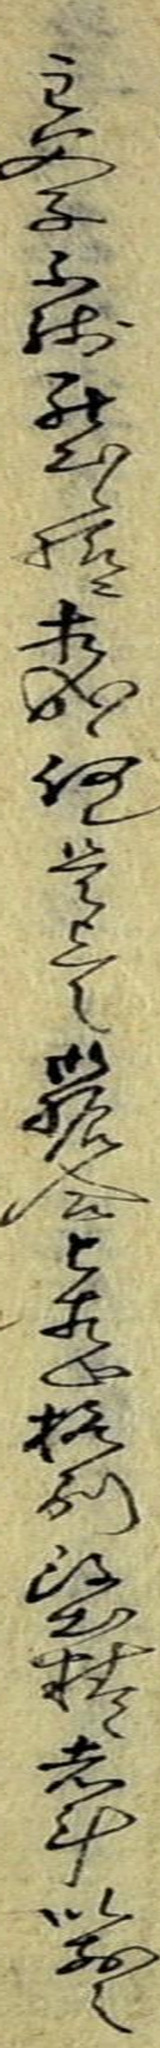主父子不残罷出候様に相成候何れ是迄之御振合被相止格別致出精候者斗以前之
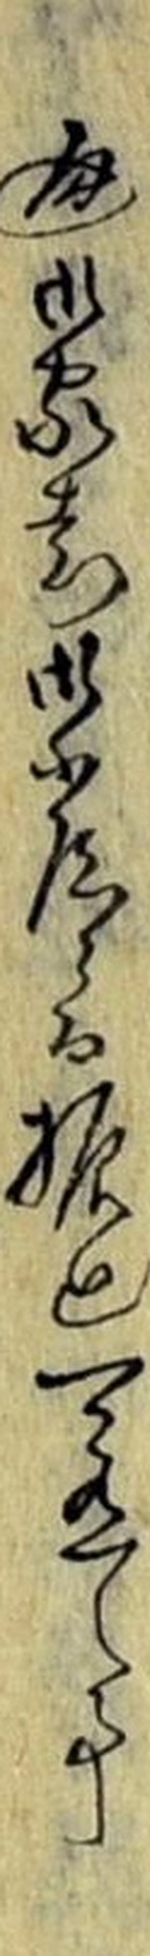通御家老御小屋に而振廻可有之事
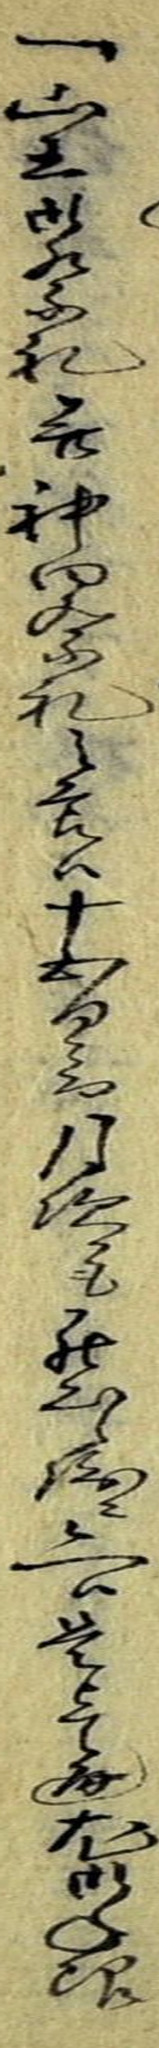一山王御祭礼并神田祭礼之節は十五日に而月次も罷出候儀に候へは是迄之通尤御年限

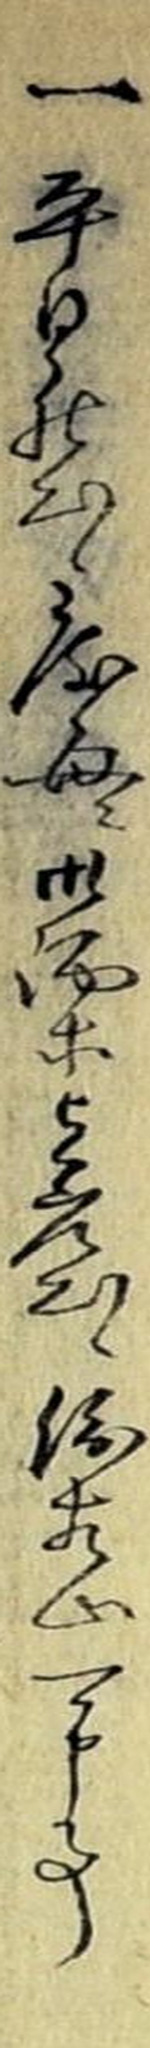一平日罷出候度毎に御酒等被差出候儀相止可申事
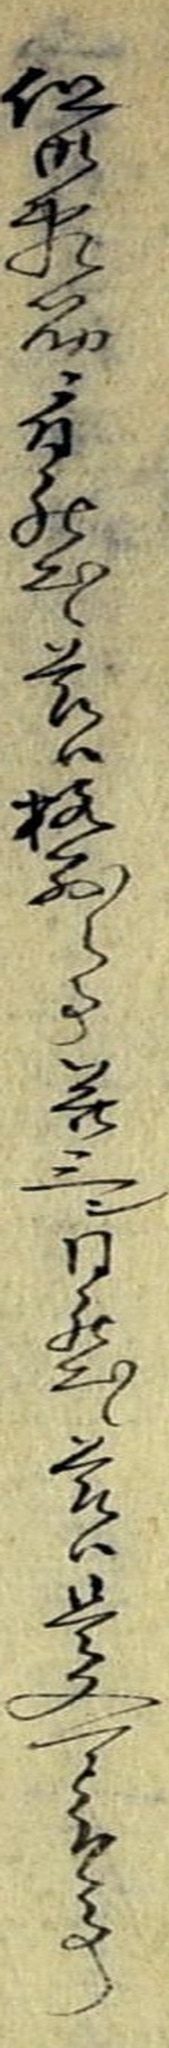但御頼筋に付罷出候節は格別之事并三ン日罷出候節は是又可被下候事
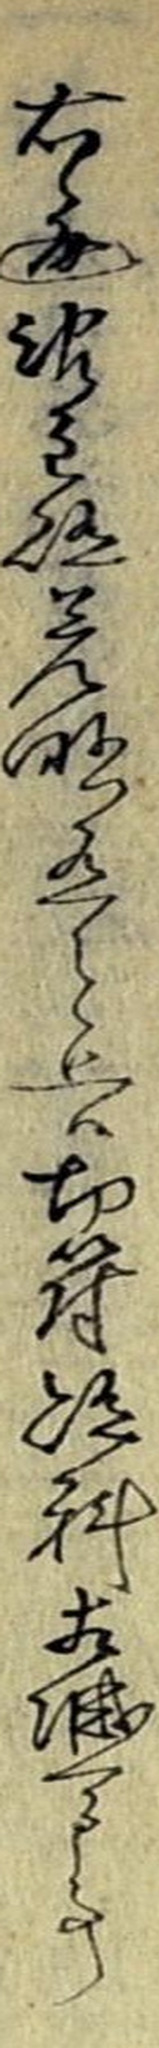右之通銀主賄差略有之上は切符賄料相減可申事
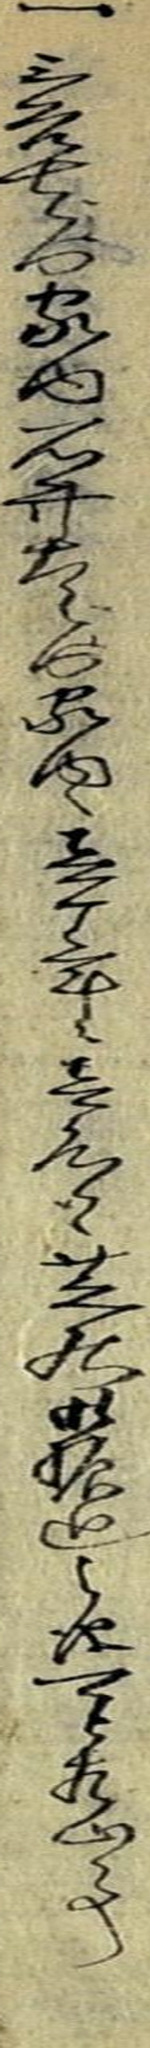一三谷七郎右衛門家内石井太郎右衛門家内へ壱ヶ年に壱度つヽ芝居御振廻之儀可相止事
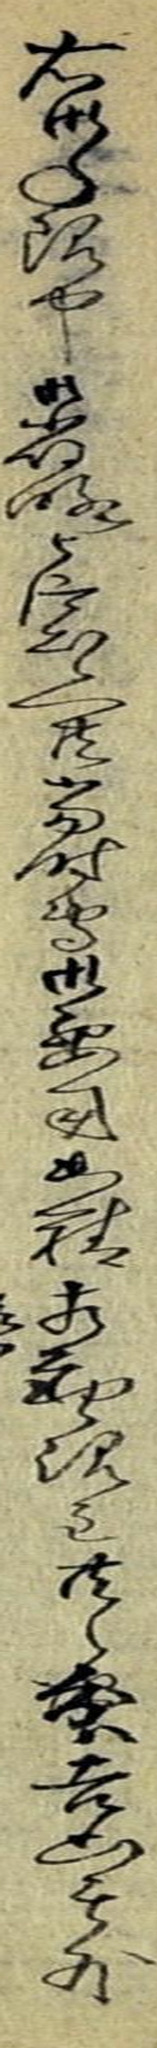右御年限中御省略被仰出候へ共当時専要用出精相勤候銀主共之貧吉凶其外
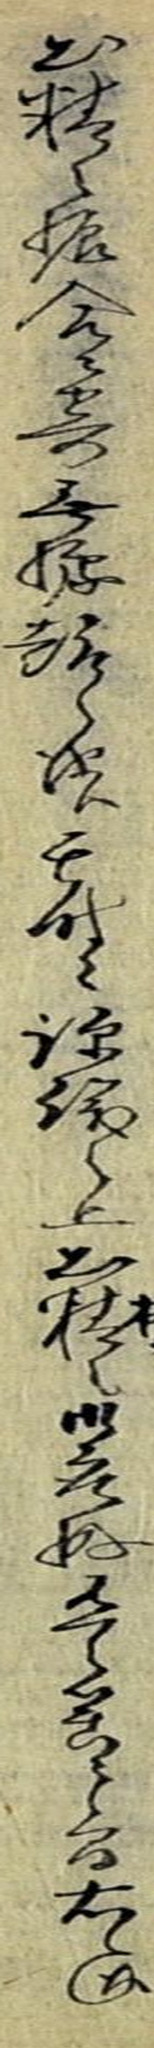出精之振合に寄無拠趣之儀は其時々評儀之上出精之御取扱有之筈に候間右之趣
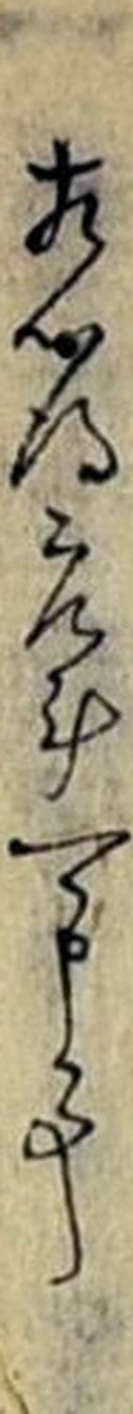相心得取斗可申事
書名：命令之部 四
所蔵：福井県文書館 Fukui Prefectural Archives
